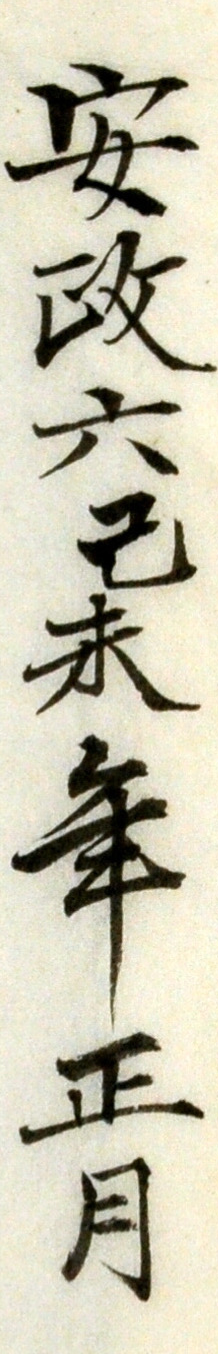安政六己未年正月
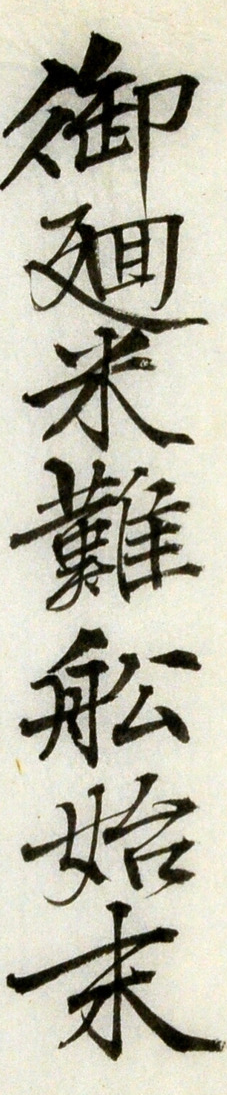御廻米難舩始末

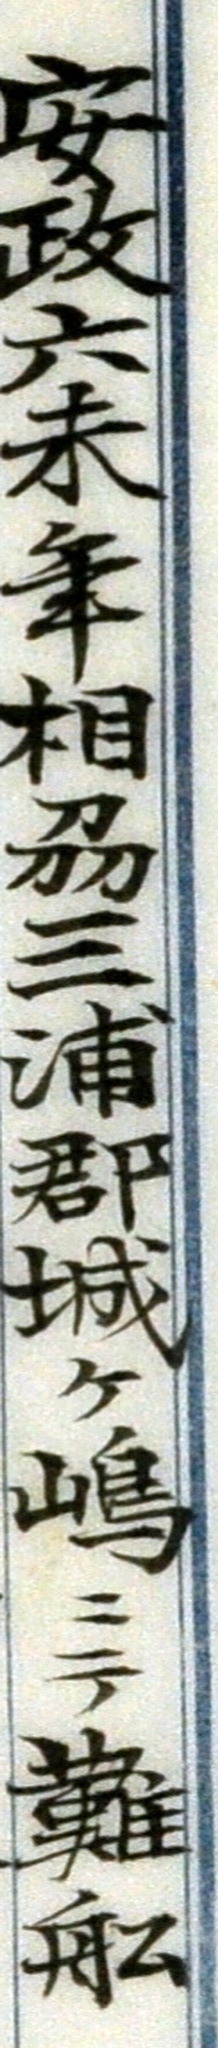安政六未年相州三浦郡城ヶ嶋ニテ難船
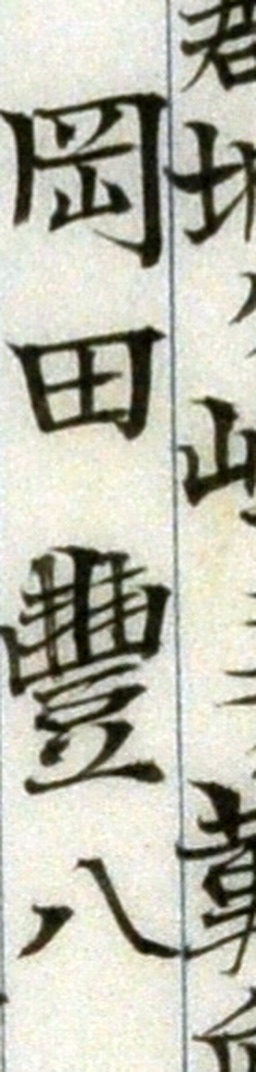岡田豊八
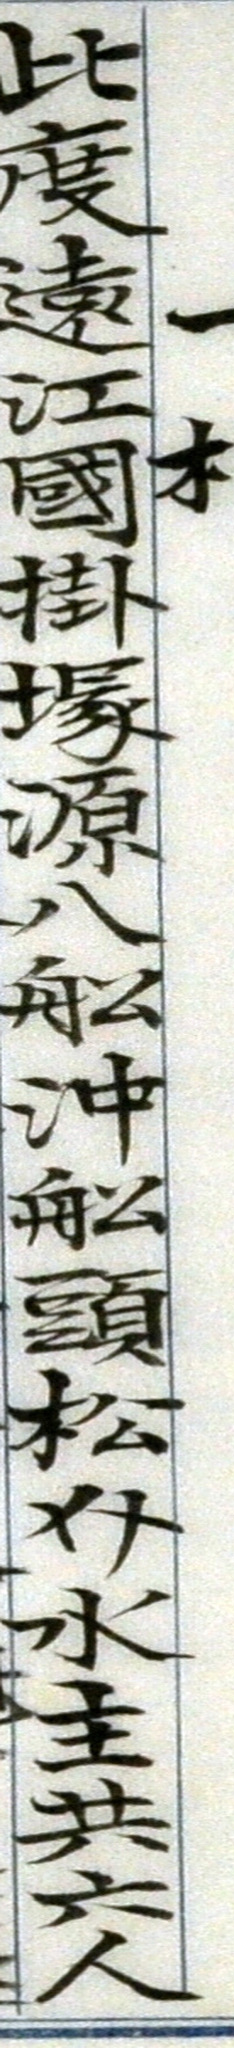此度遠江国掛塚源八船沖船頭松介水主共六人
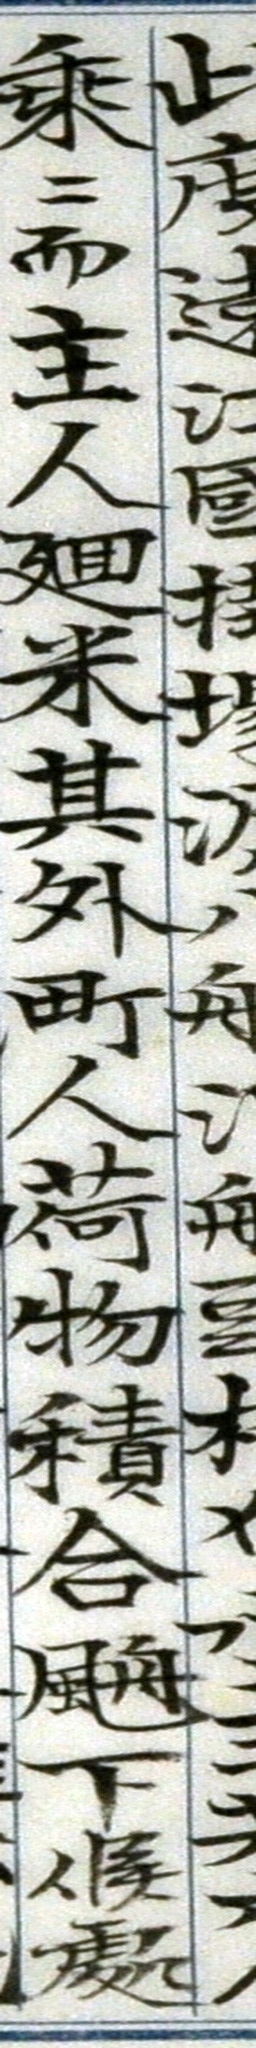乗に而主人廻米其外町人荷物積合下候處
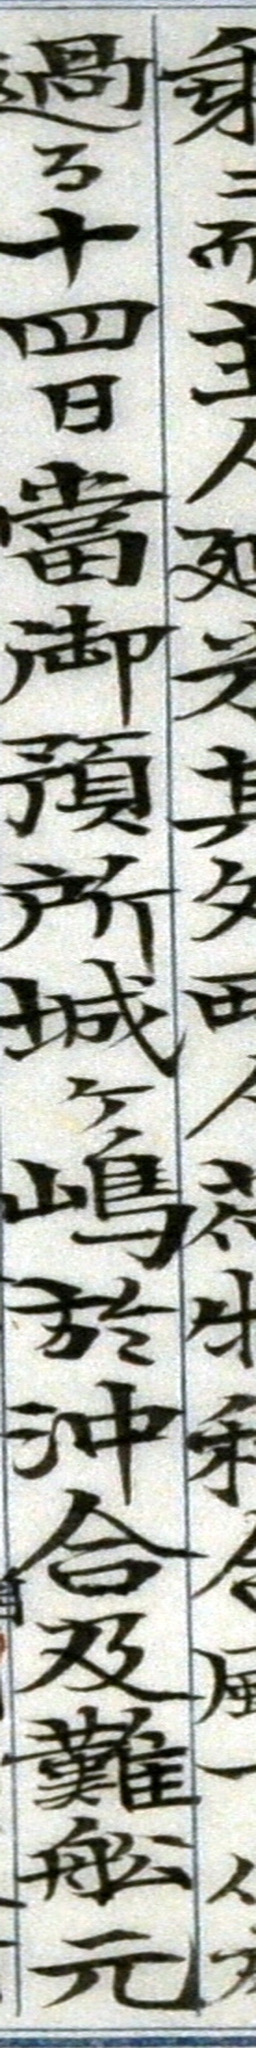過る十四日当所預所城ヶ島於沖合及難船元
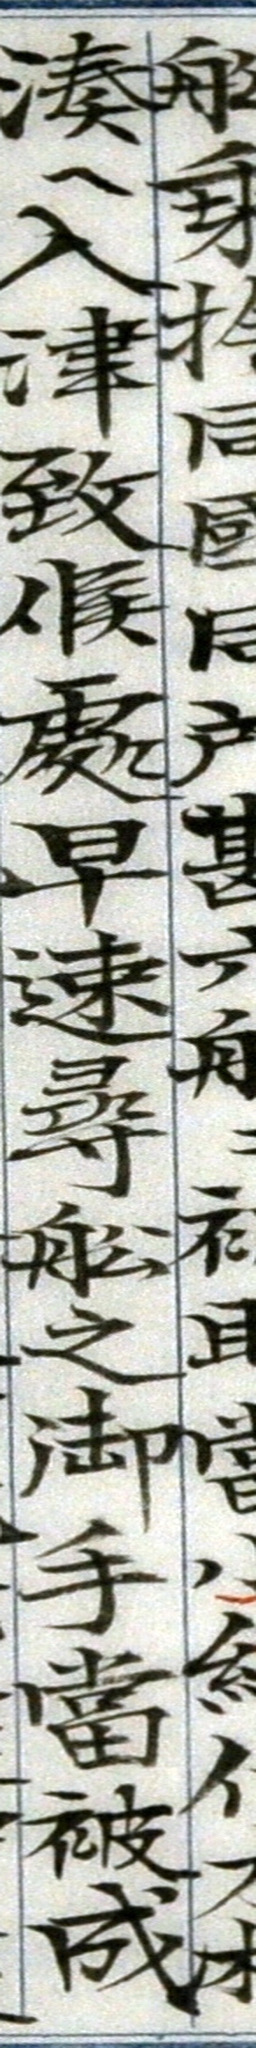湊へ入津致候處早速尋船之御手当被成
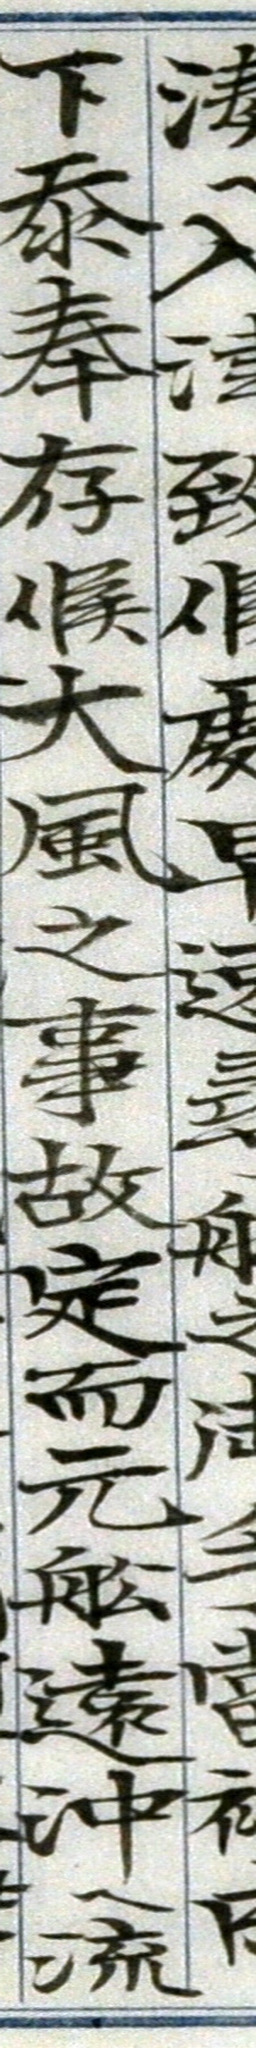下忝奉存候大風之事故定而元船遠沖へ流
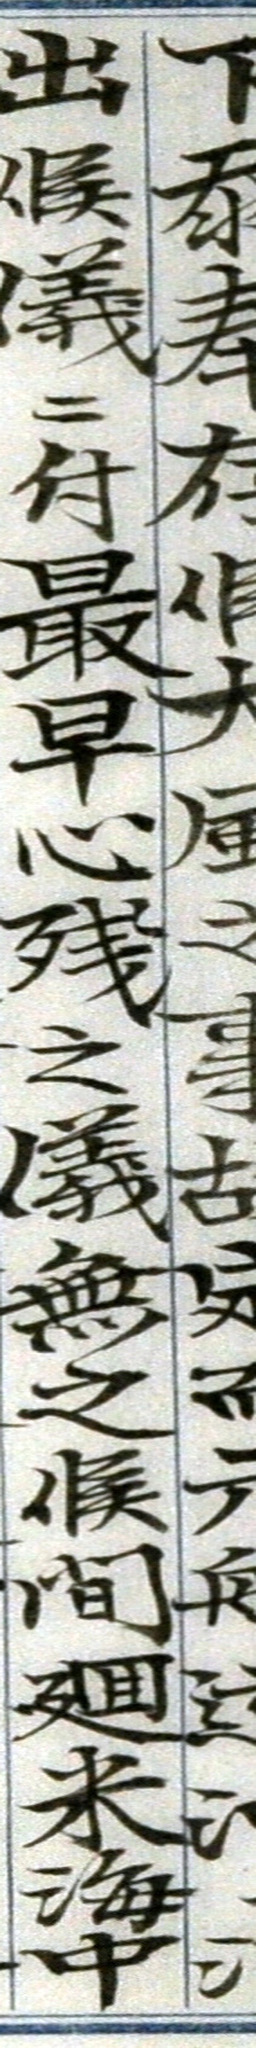出候儀に付最早心残之儀無之候間廻米海中
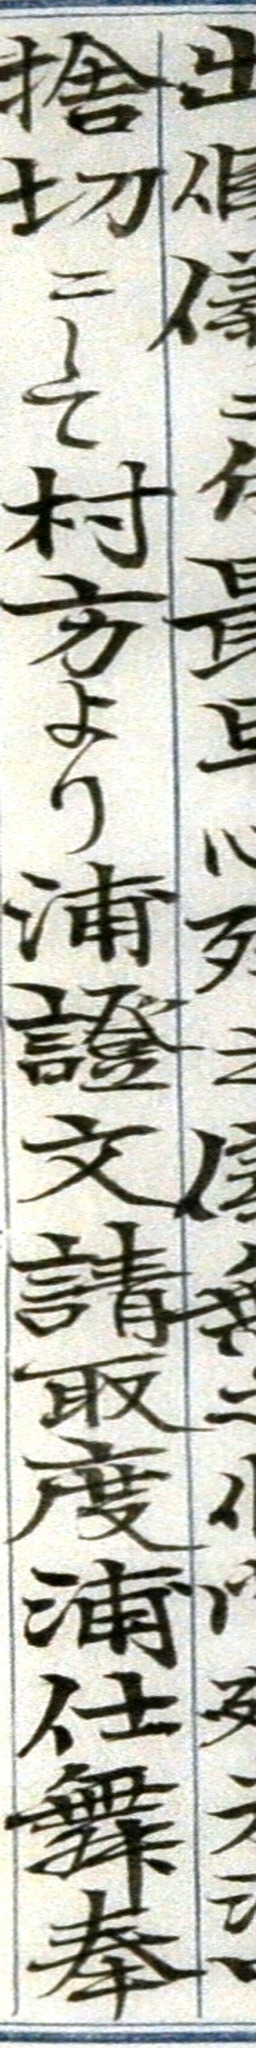捨切にして村方より浦証文取度浦仕舞奉

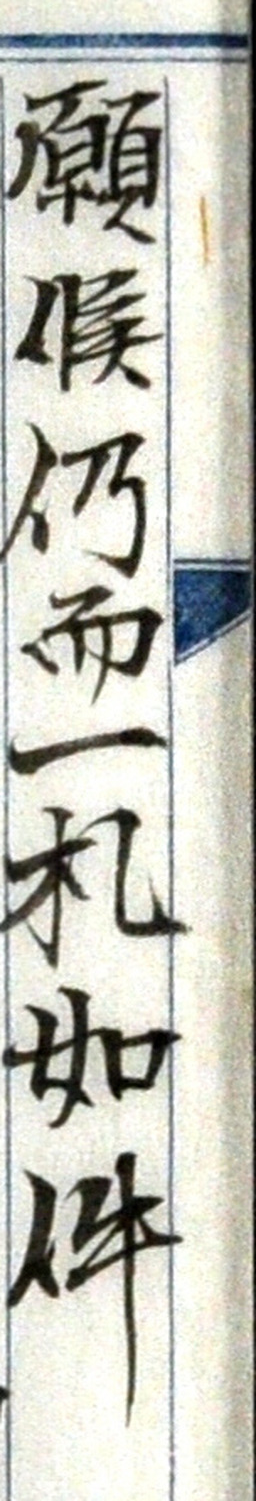願候仍而一札如件
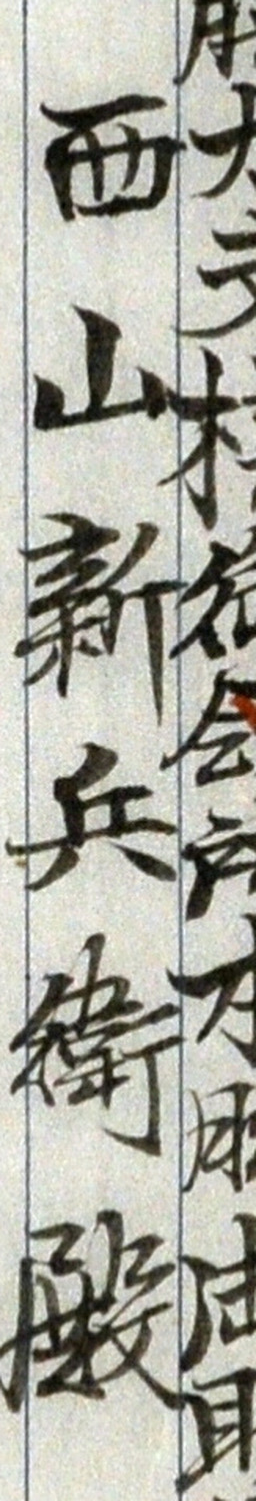西山新兵衛殿
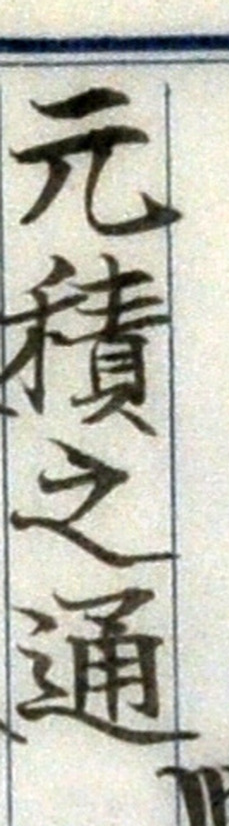元積之通
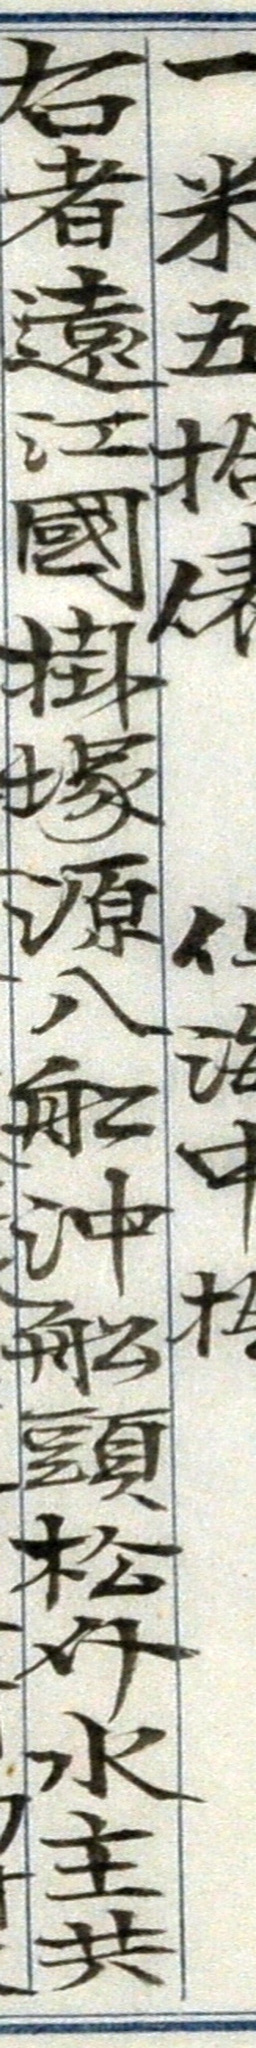右者遠江国掛塚源八船沖船頭松介水主共
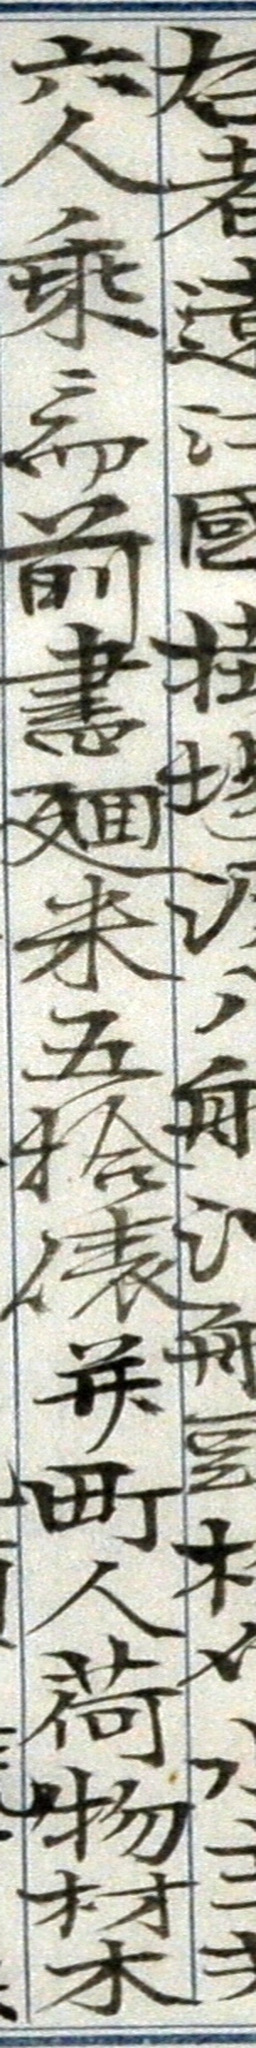六人乗に而前書廻米五拾俵并町人荷物材木
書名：御廻米難船始末
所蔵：伊那市立高遠町図書館・合同会社AMANE
